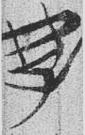好
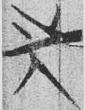先人
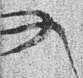又（有）
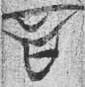言
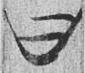曰
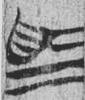馬
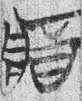𨟻（將）
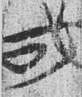或
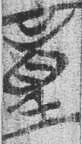童
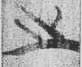之
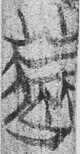速
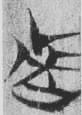○（來）
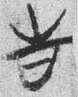告
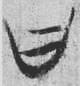曰
